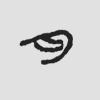月
